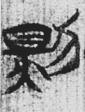則
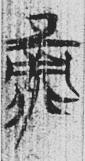录（祿）
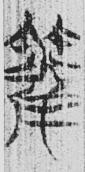○（爵）
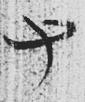又（有）
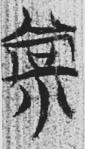○（常）
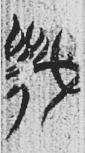幾（忌）
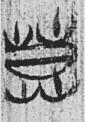莫
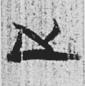之
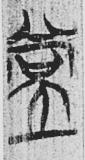○（當）
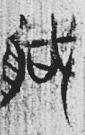戕（莊）
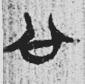公
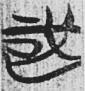或（又）
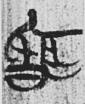䎽（問）
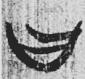曰
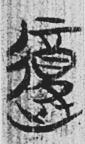○（復）
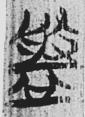盤
